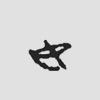女
